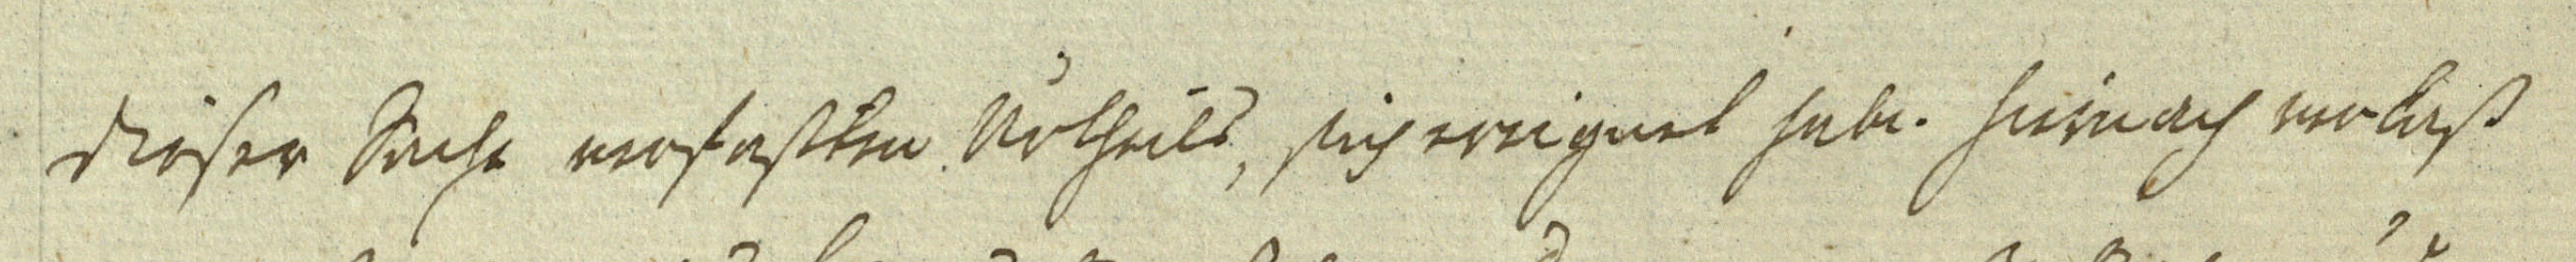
dieser Sache verfasten Urtheils, sich ereignet habe. Hiernach verlas
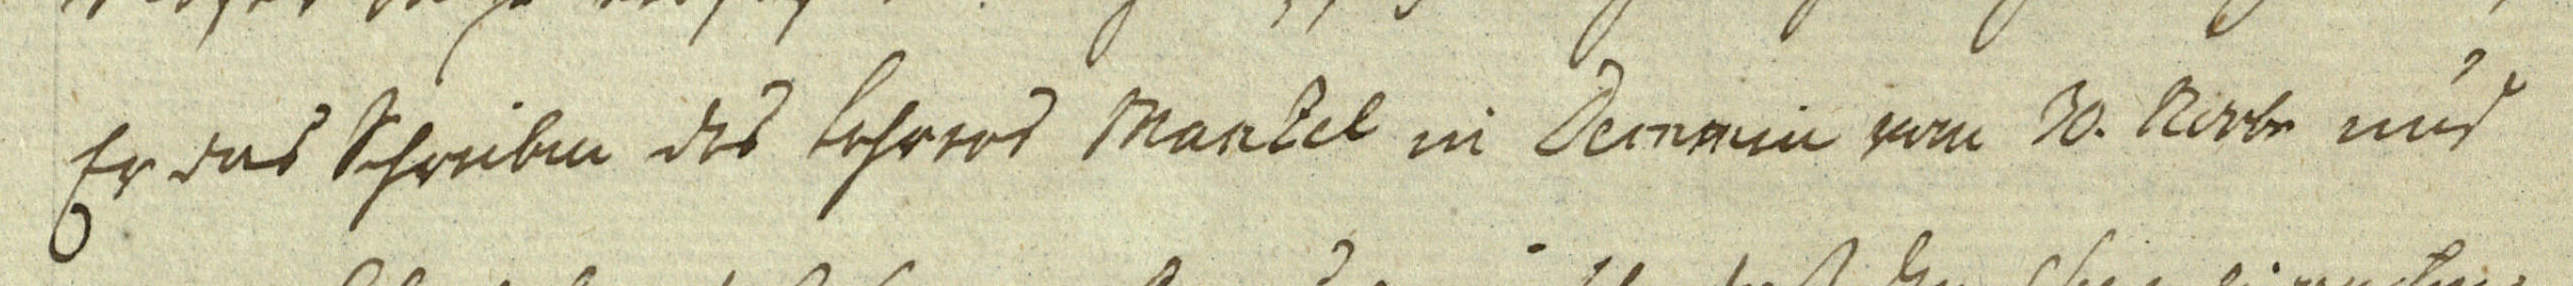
Er das Schreiben des Lehrers Manzel in Demmin vom 30. Novbr und
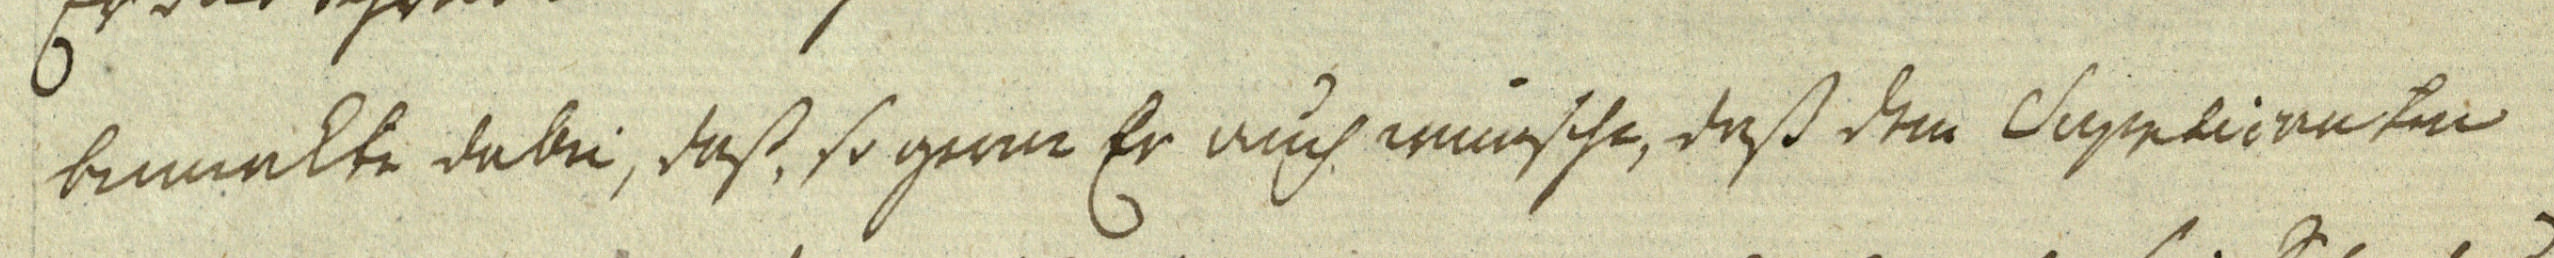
bemerkte dabei, daß, so gerne Er auch wünsche, daß dem Supplicanten
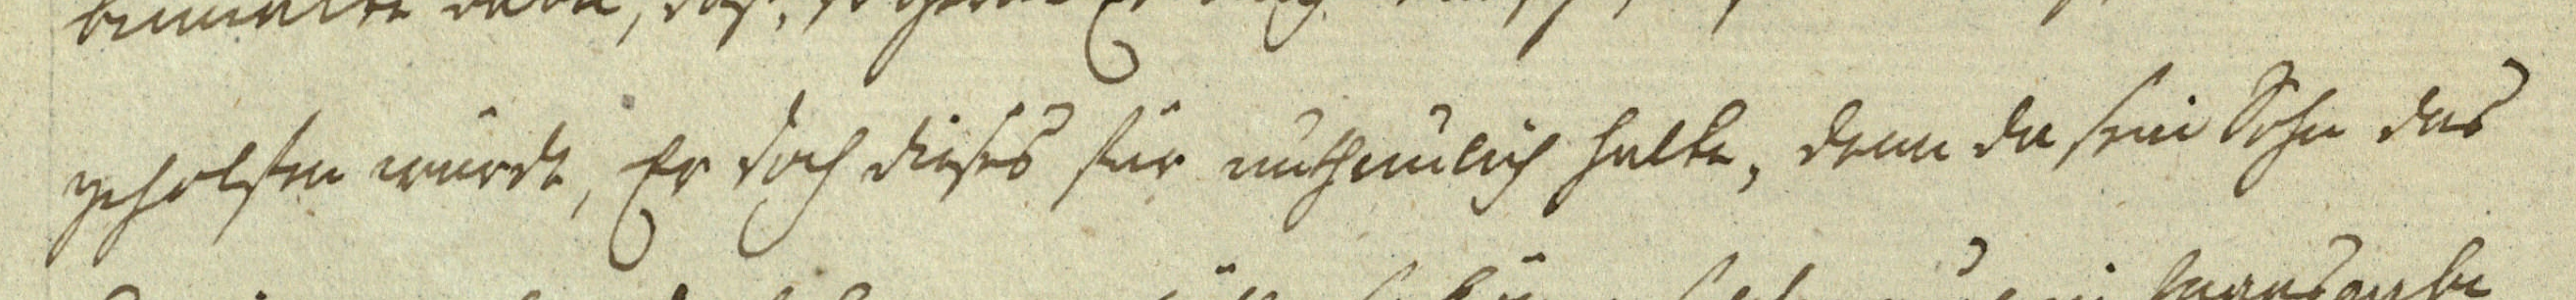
geholfen würde, Er doch dieses für unthunlich halte, denn da sein Sohn das
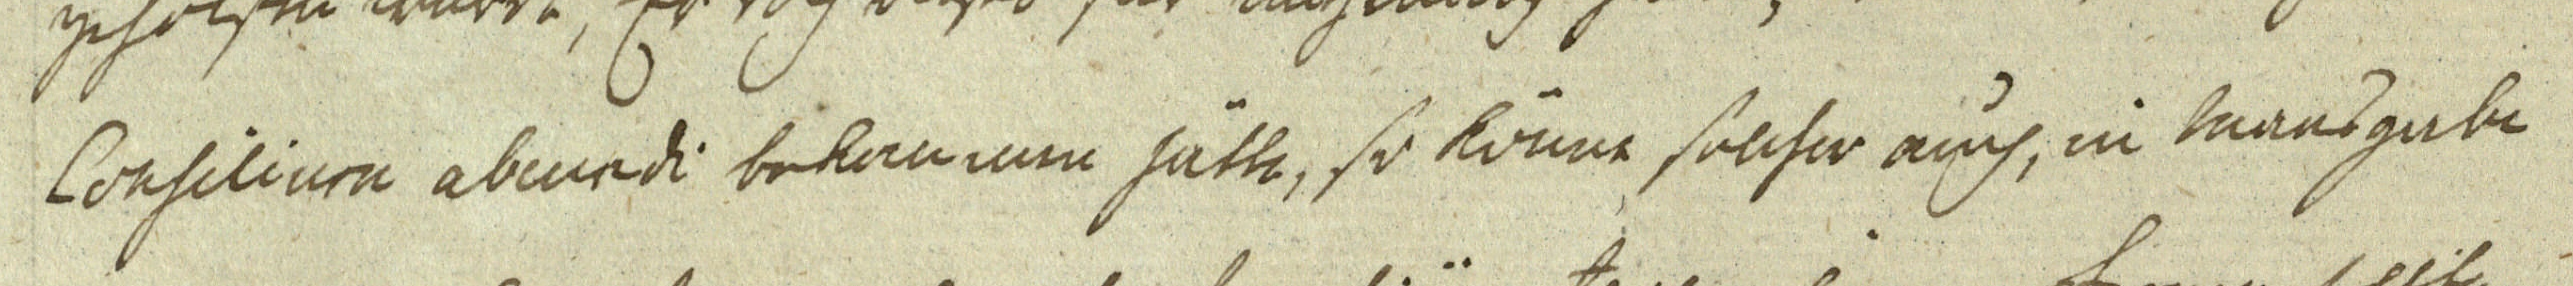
Consilium abeundi bekommen hätte, so könne solcher auch, in Maasgabe
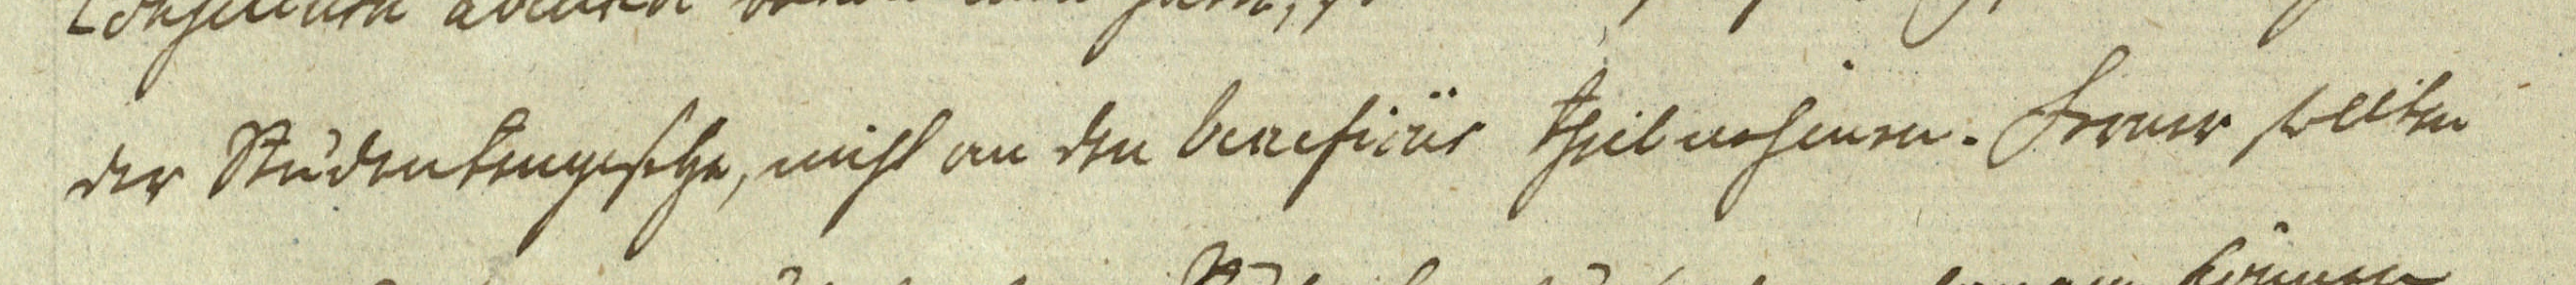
der Studentengesetze, nicht an den beneficiis theilnehmen. Ferner sollten
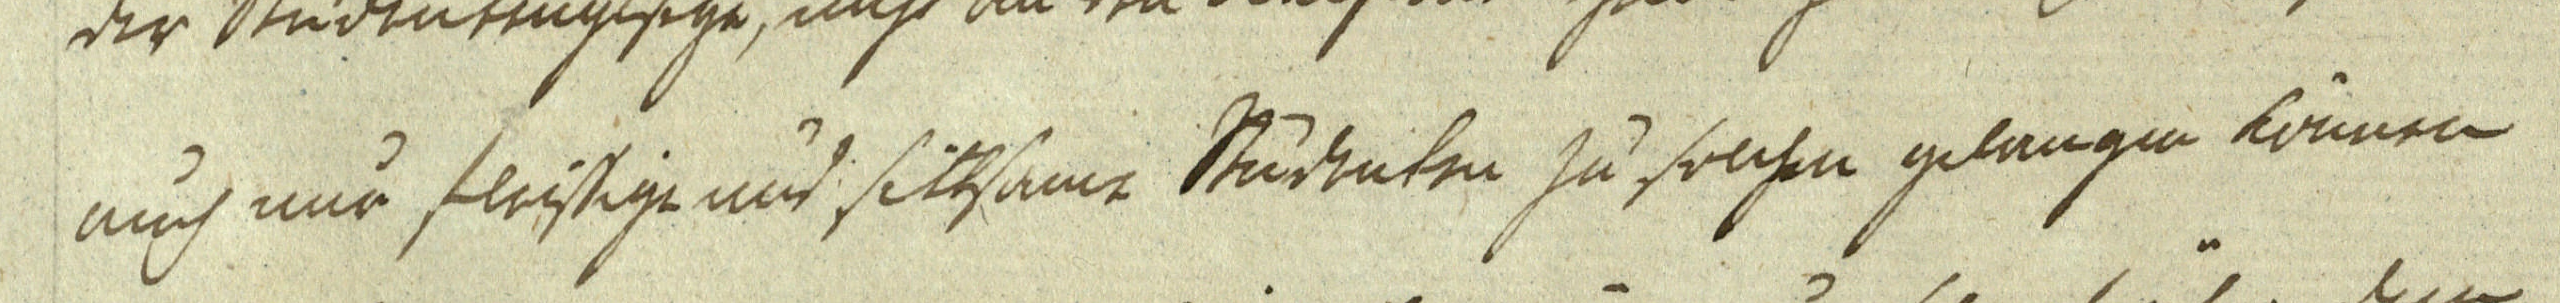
auch nur fleissige und sittsame Studenten zu solchen gelangen können
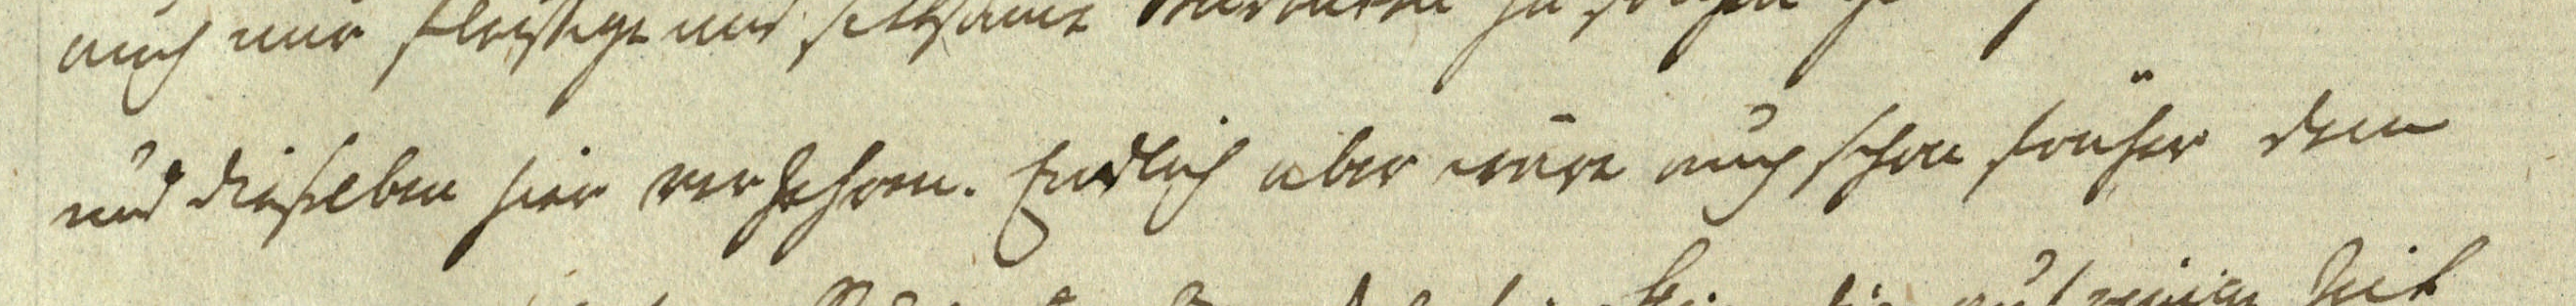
und dieselben hier verzehren. Endlich aber wäre auch schon früher dem
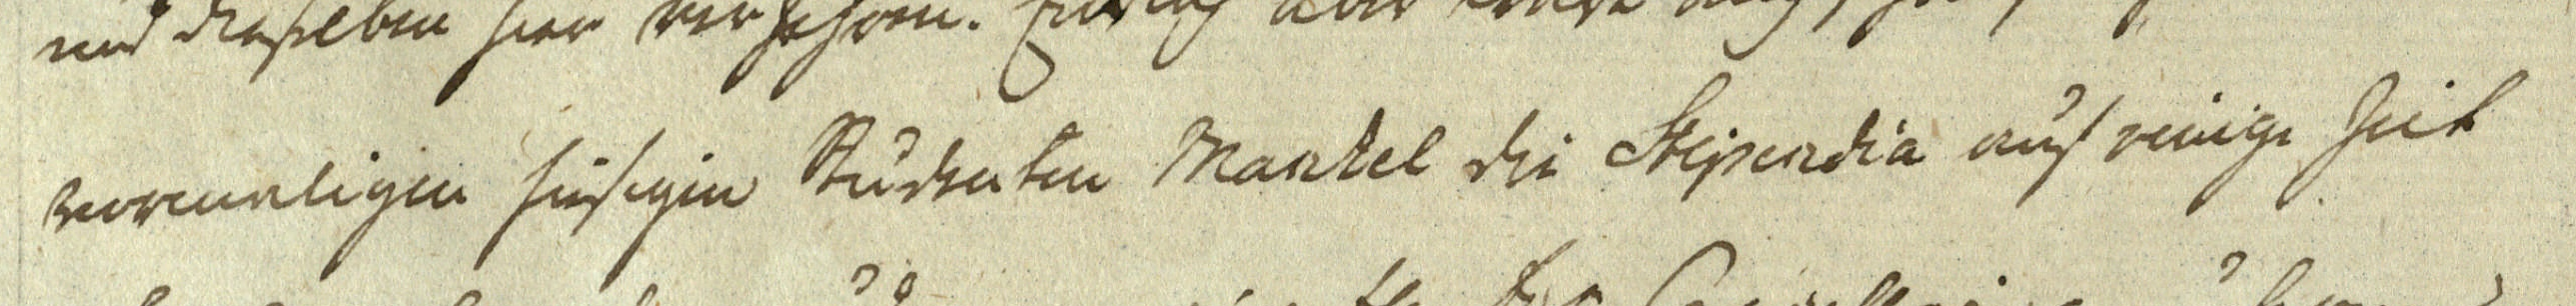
vormaligen hiesigen Studenten Manzel die Stipendia auf einige Zeit
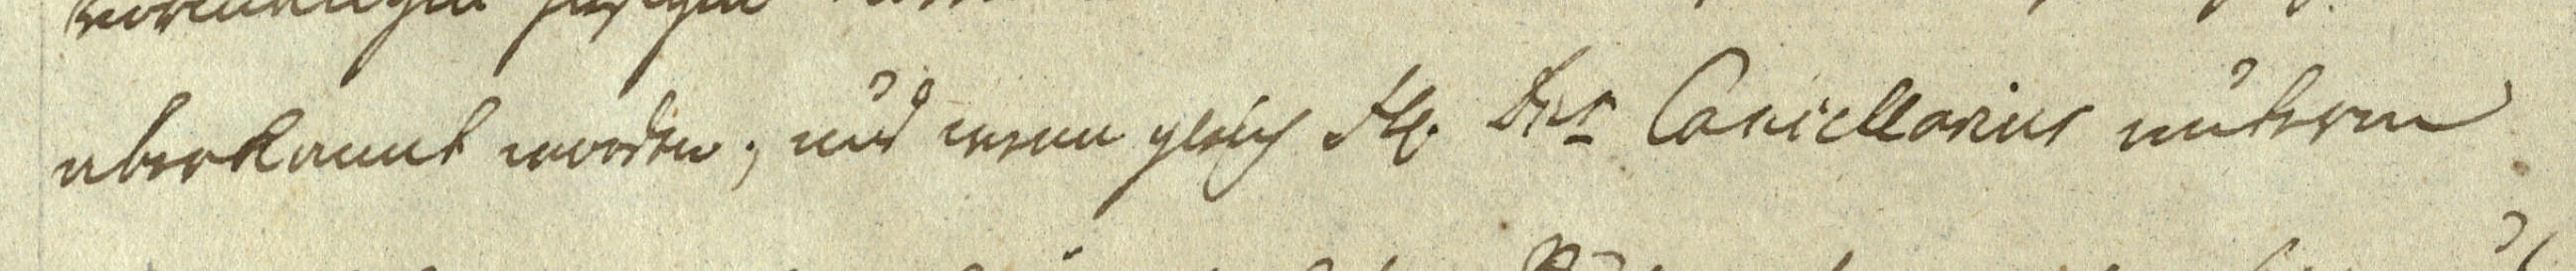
aberkannt worden; und wenn gleich Ill. Dns Cancellarius unterm
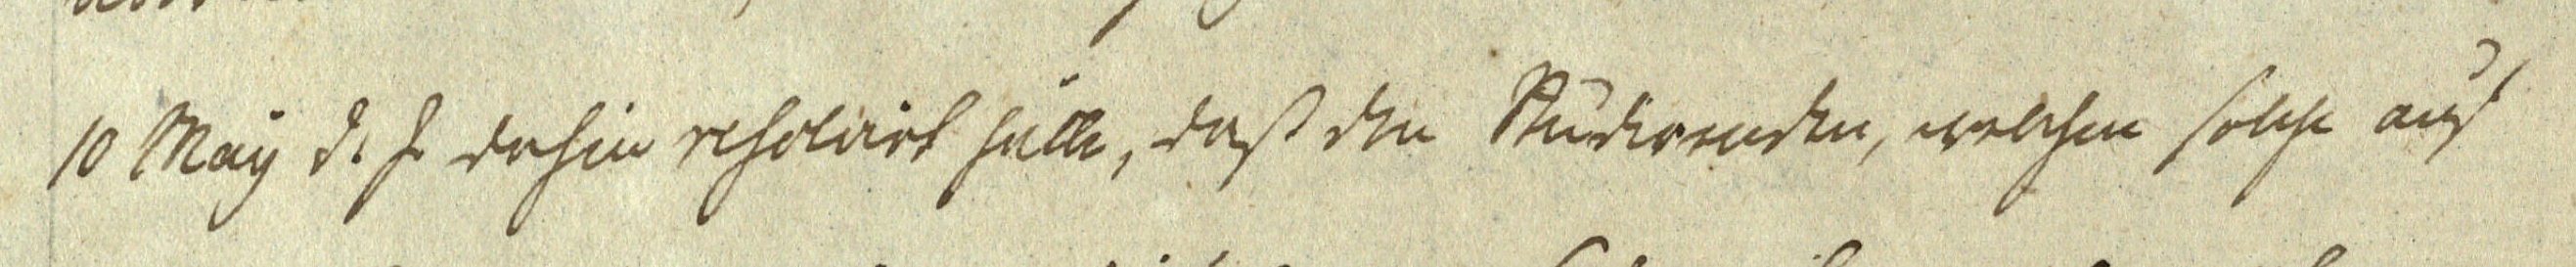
10 Maÿ d. J. dahin resolvirt hätte, daß den Studirenden, welchen solche auf
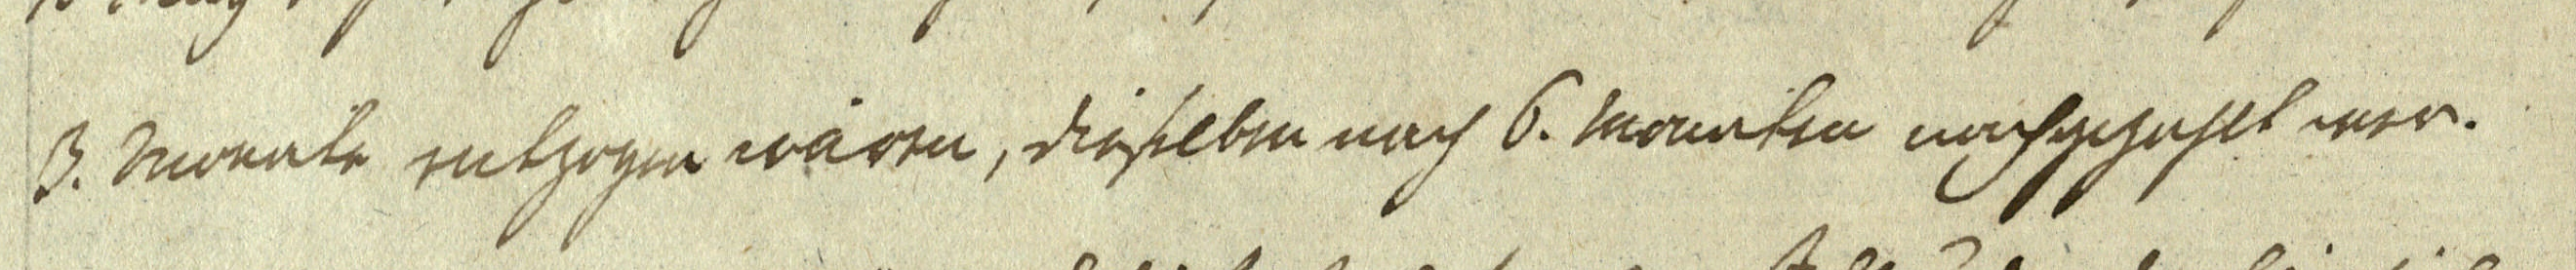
3. Monate entzogen wären, dieselben nach 6. Monaten nachgezahlt wer¬
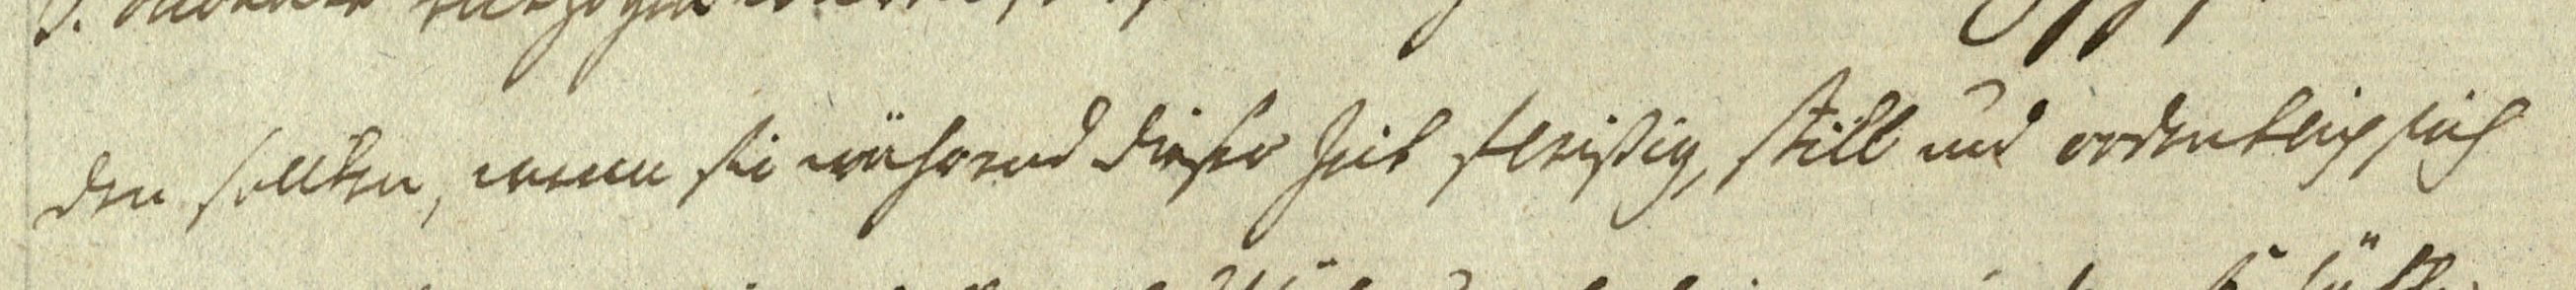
den sollten, wenn sie während dieser Zeit fleißig, still und ordentlich sich
